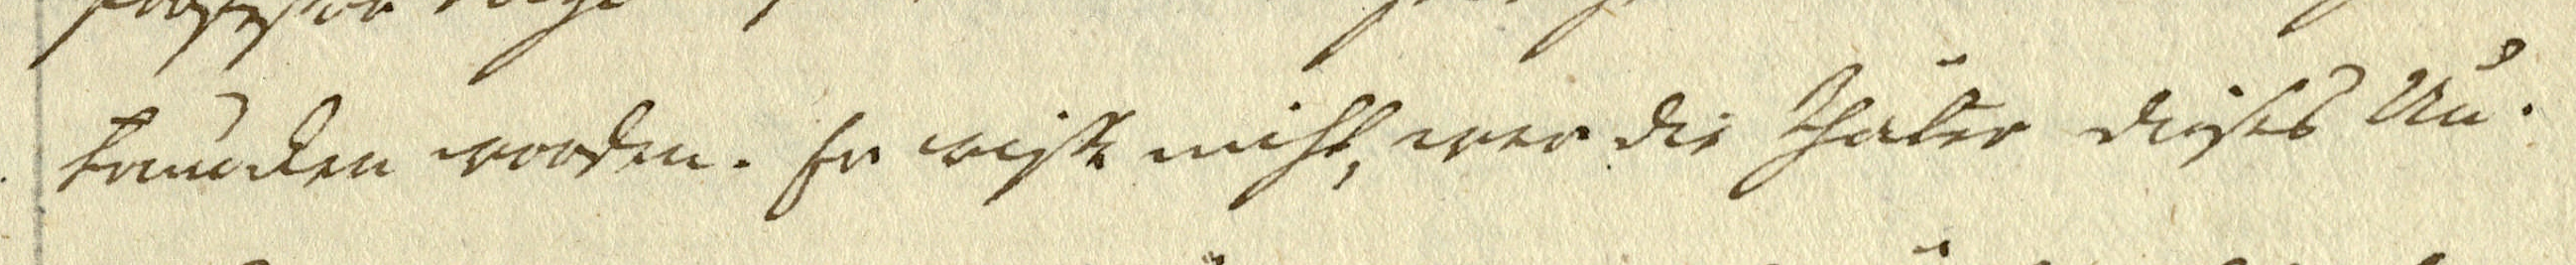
truncken worden. Er wisse nicht, wer die Thäter dieses Un¬
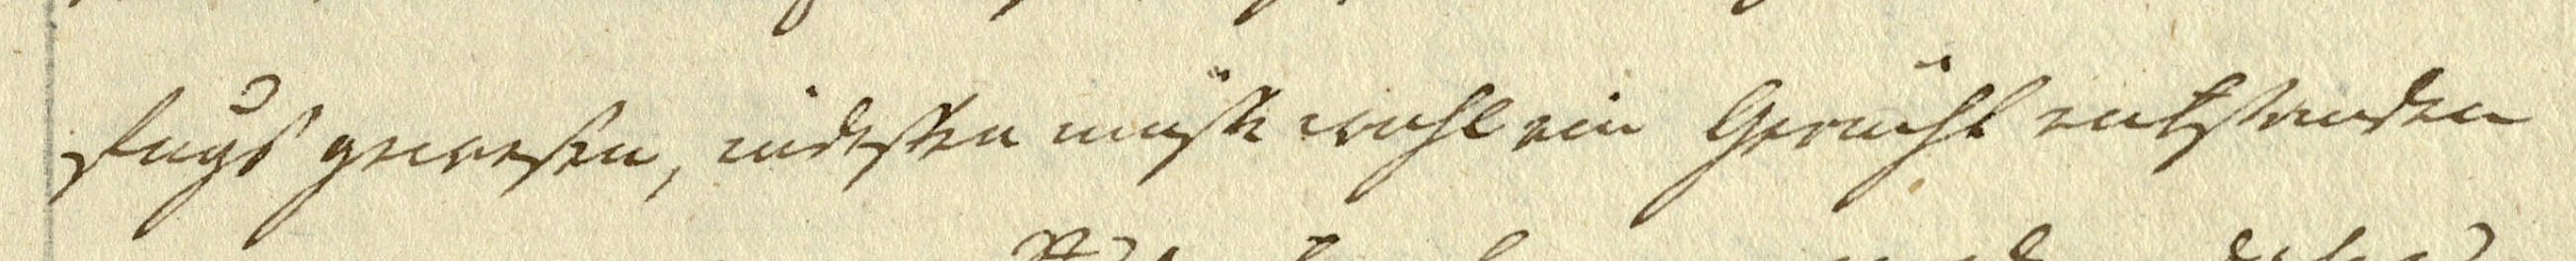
fugs gewesen, indessen müsse wohl ein Gerücht entstanden
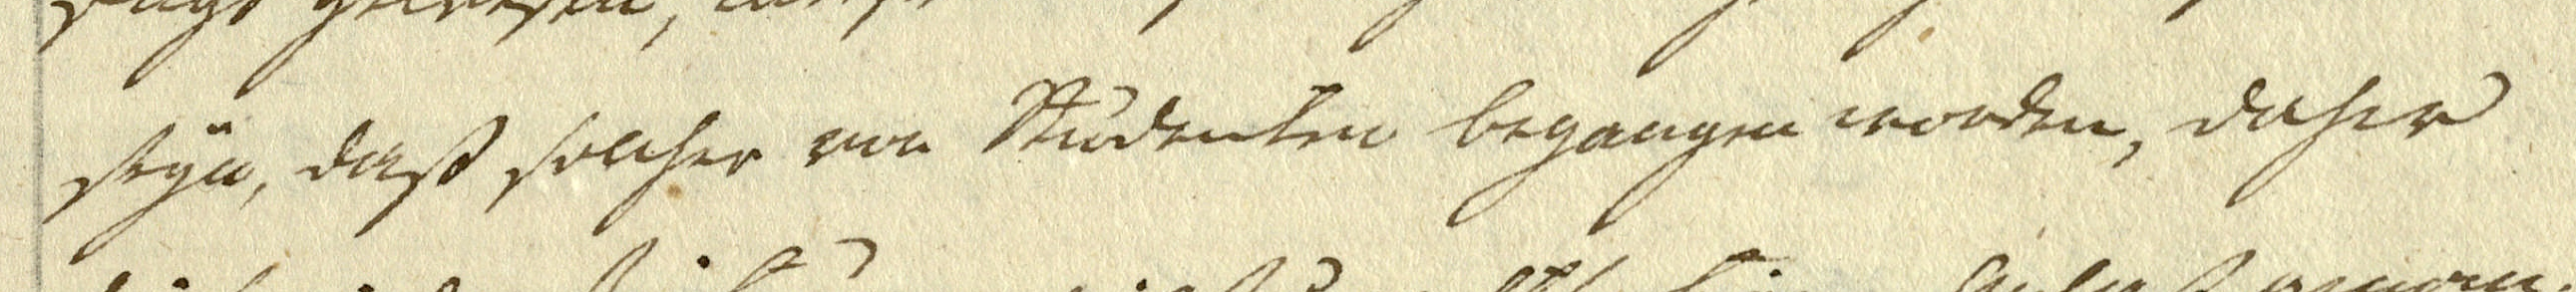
seÿn, daß solcher von Studenten begangen worden, daher
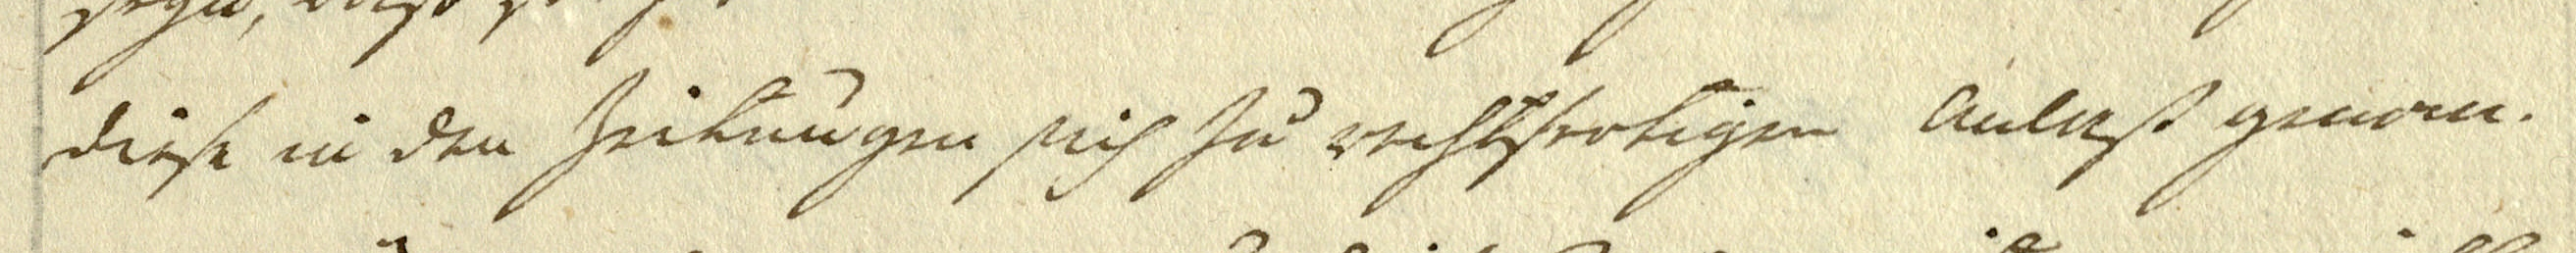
diese in den Zeitungen sich zu rechtfertigen Anlaß genom¬
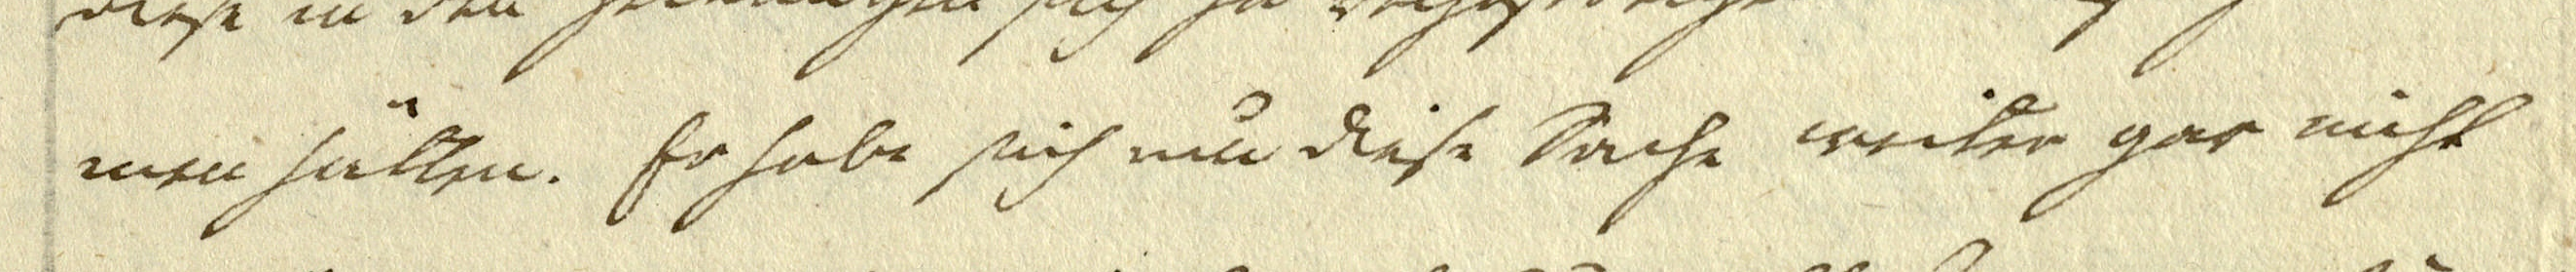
men hätten. Er habe sich um diese Sache weiter gar nicht
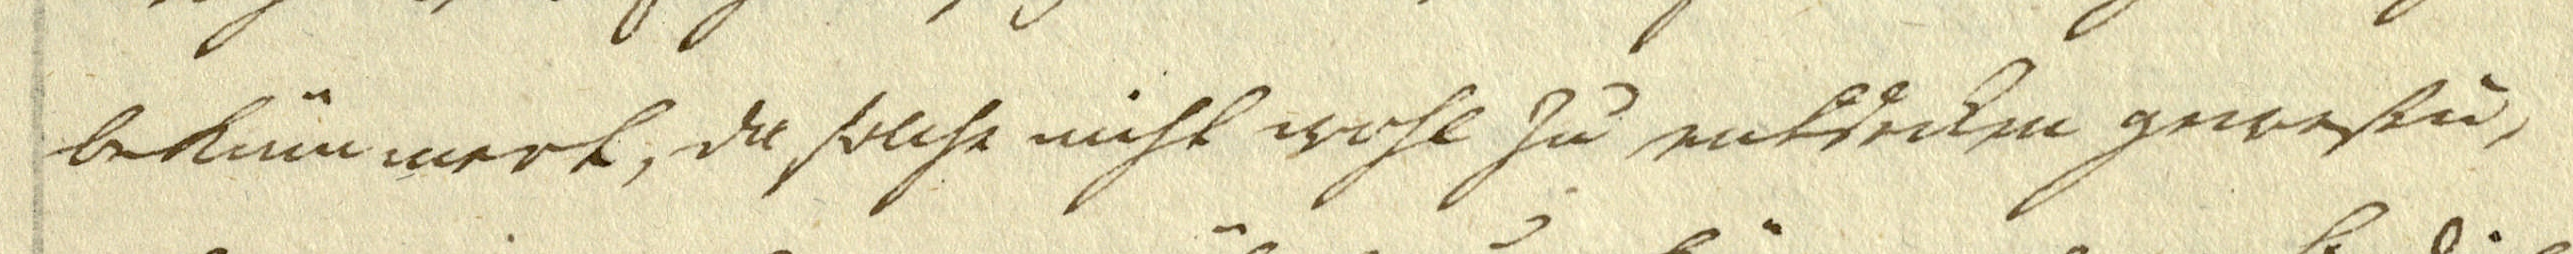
bekümmert, da solche nicht wohl zu entdecken gewesen,
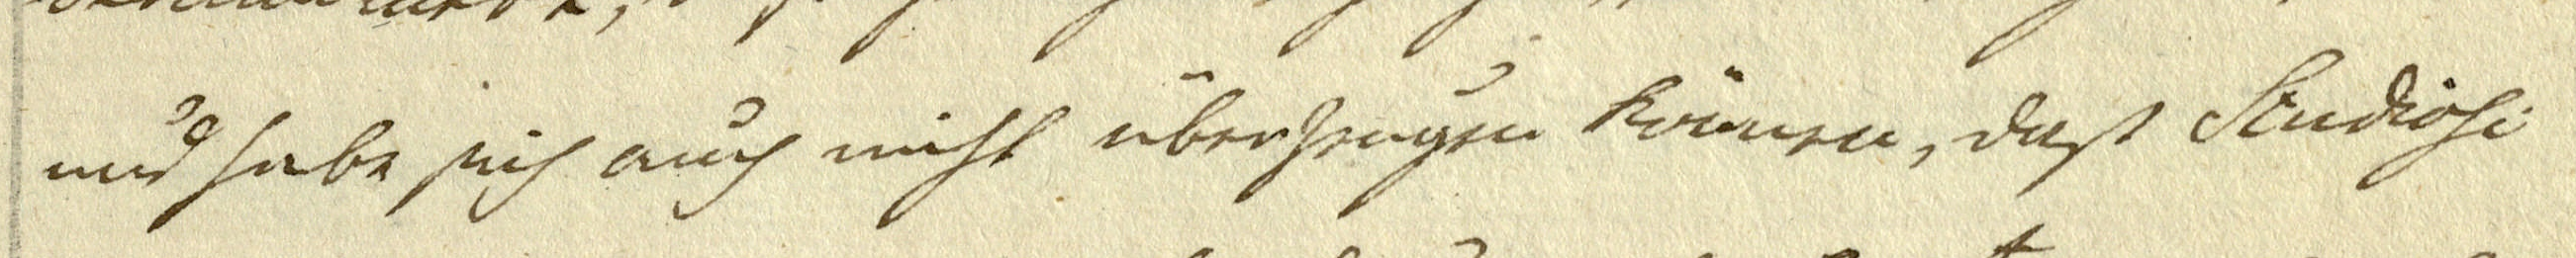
und habe sich auch nicht überzeugen können, daß Studiosi
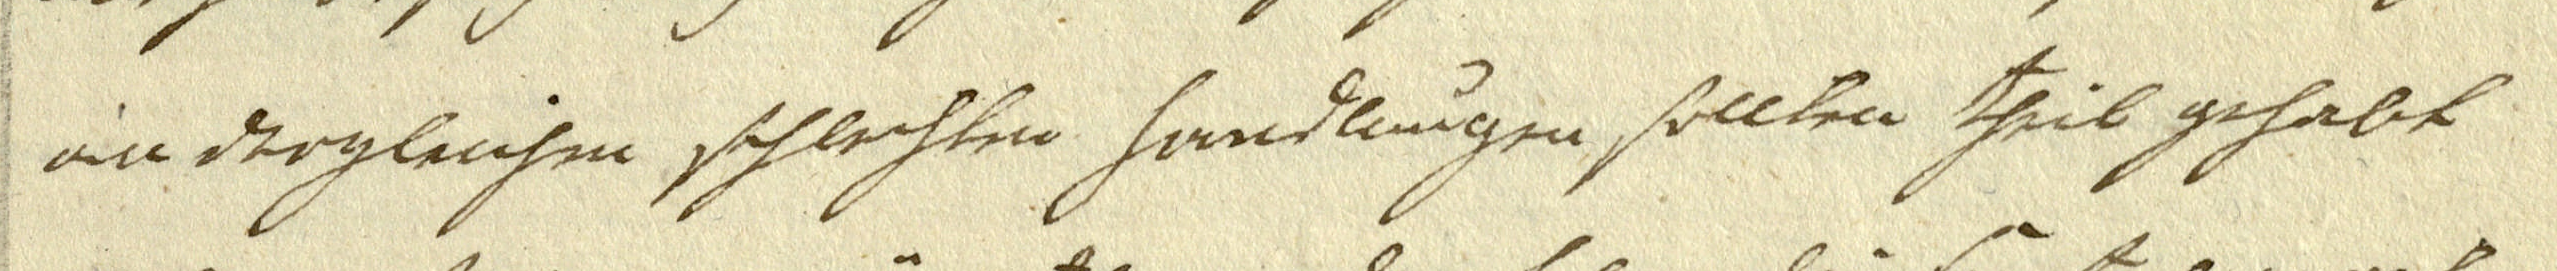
an dergleichen schlechten Handlungen sollten Theil gehabt
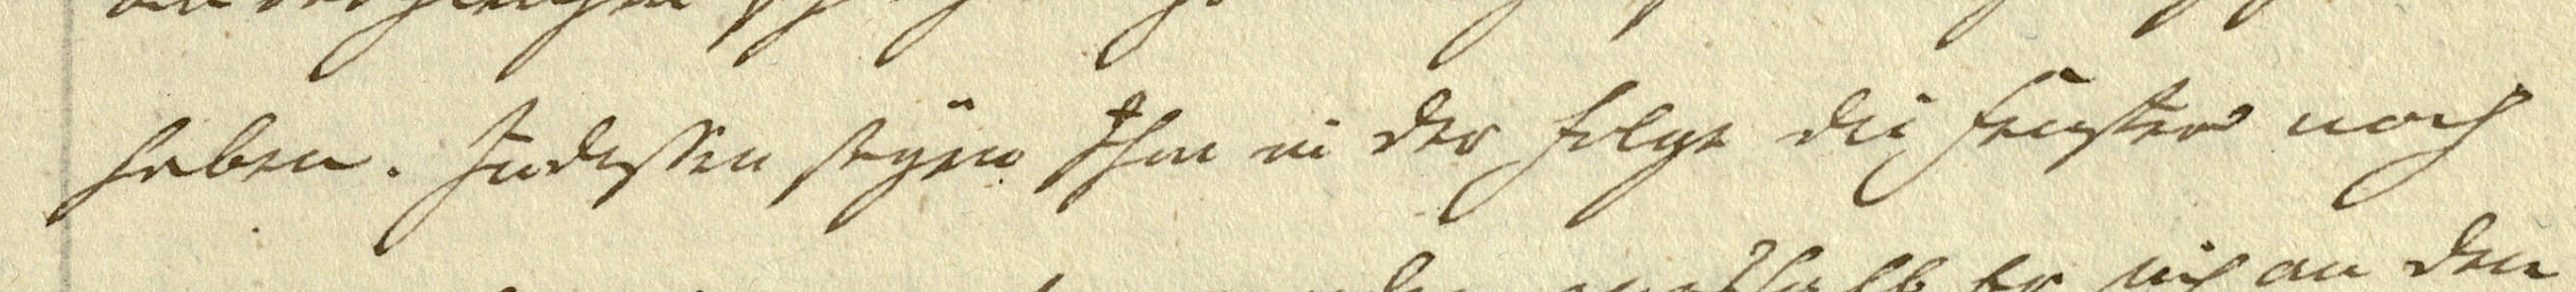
haben. Indessen seÿen Ihm in der Folge die Fenster noch
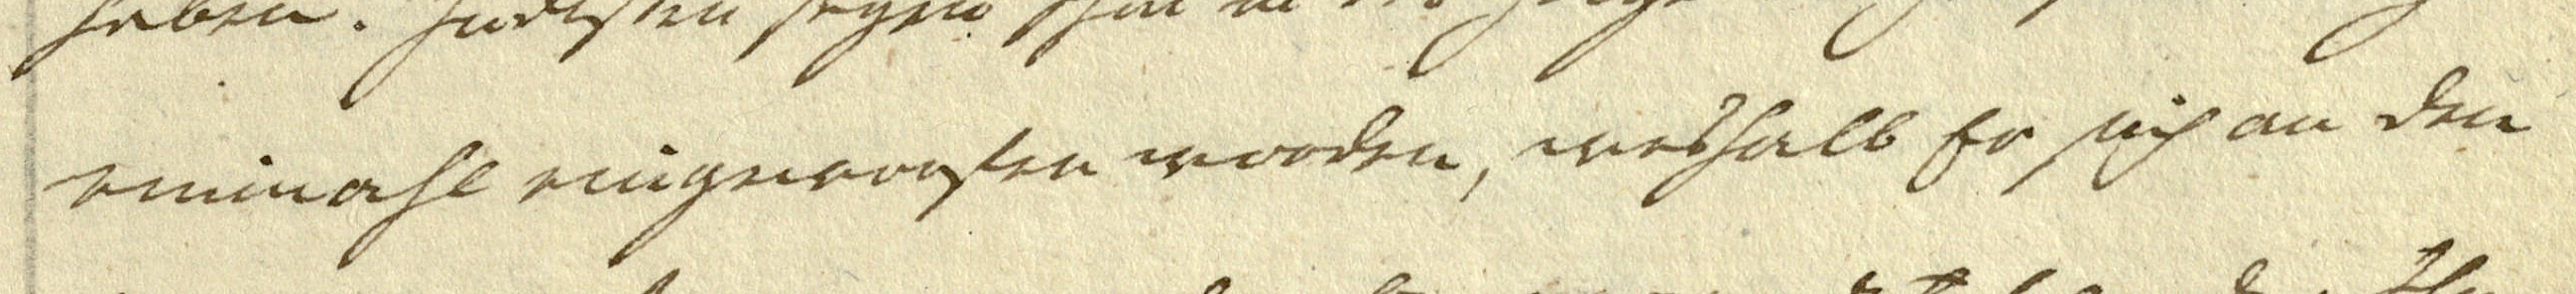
einmahl eingeworfen worden, weshalb Er sich an den
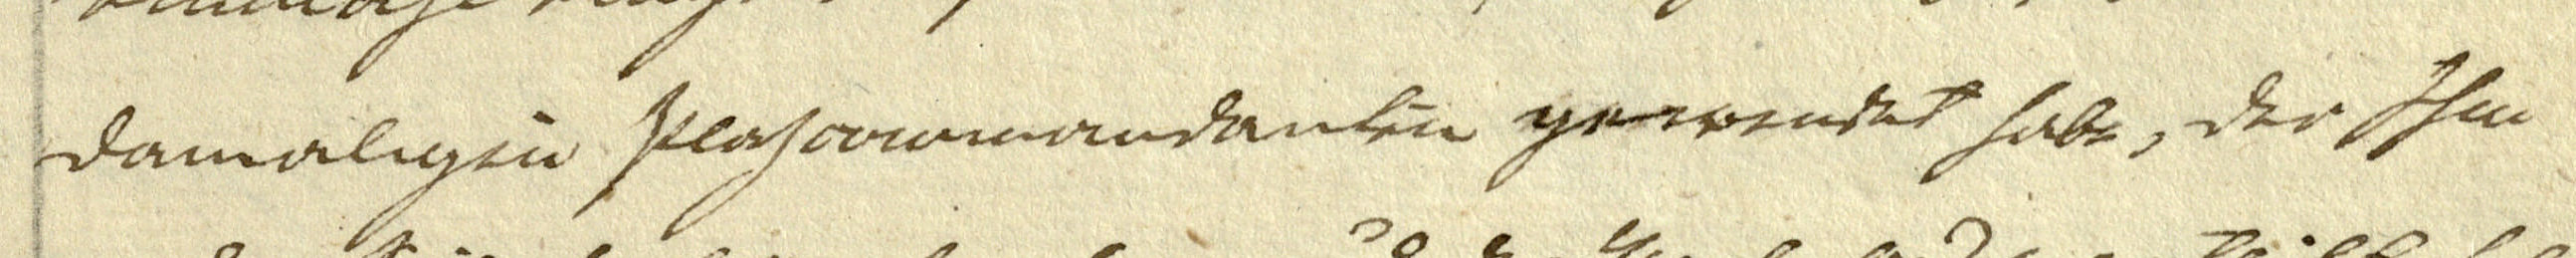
damaligen Plazcommandanten gewendet habe, der Ihm
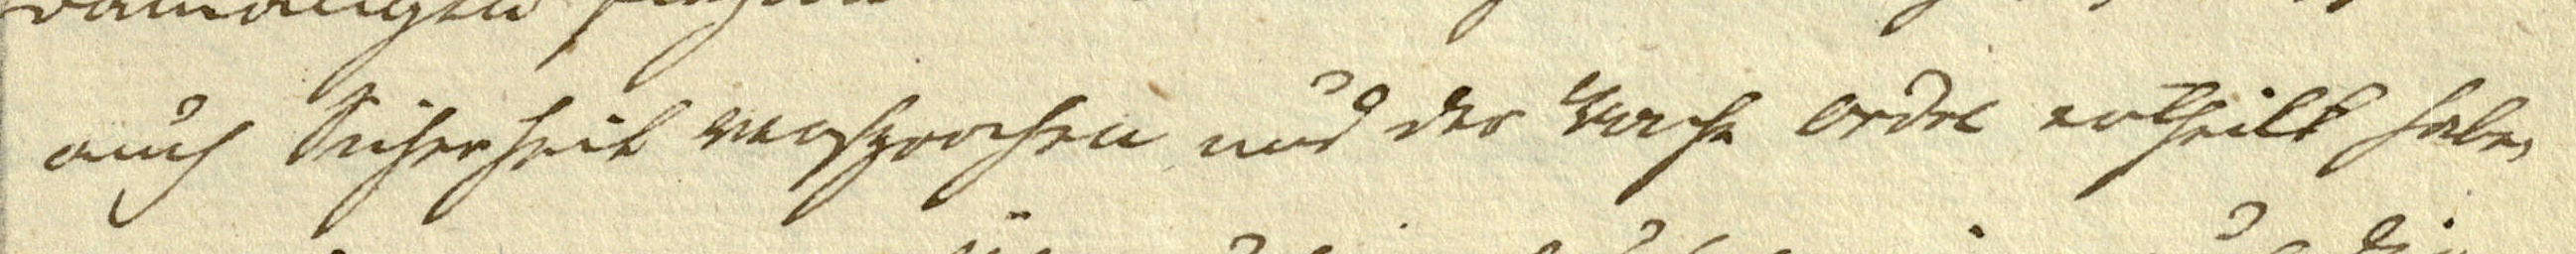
auch Sicherheit versprochen und der Wache Ordre ertheilt habe,
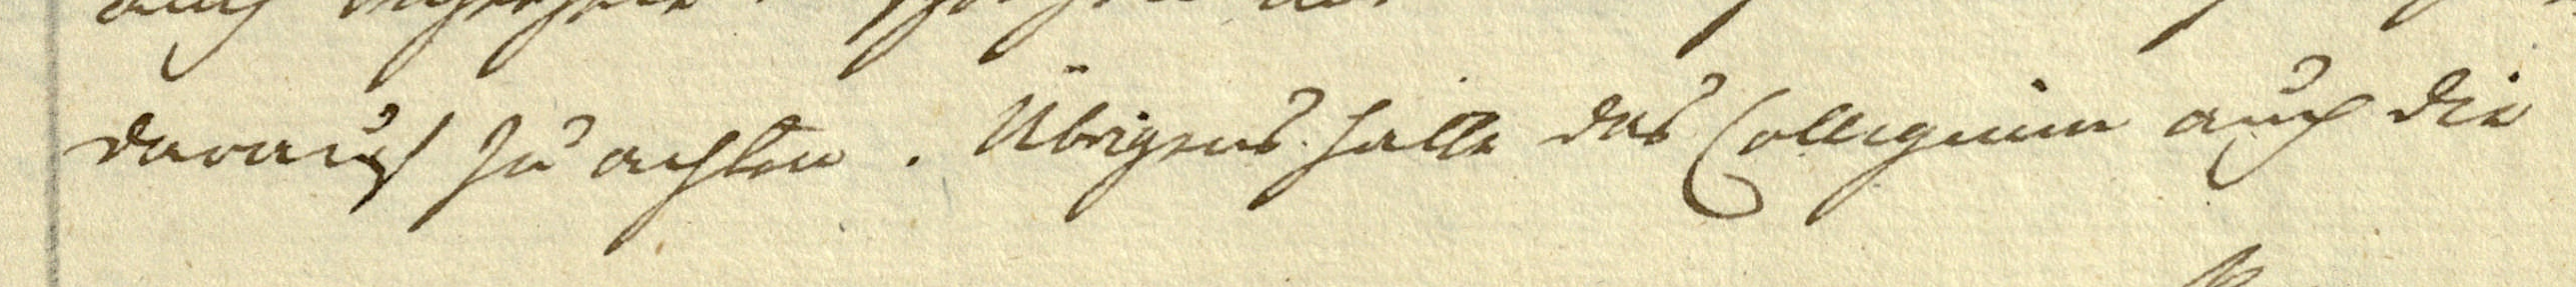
darauf zu achten. Übrigens halte das Collegium auch die
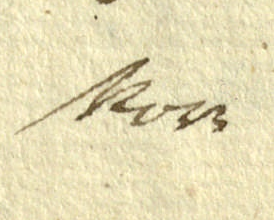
Vor.
